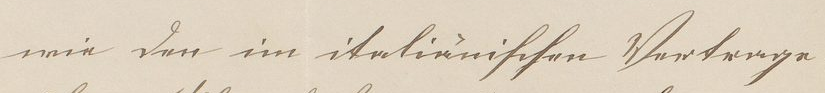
wie den im italienischen Vertrage –
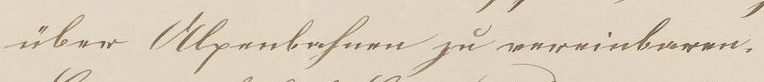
über Alpenbahnen zu vereinbaren.
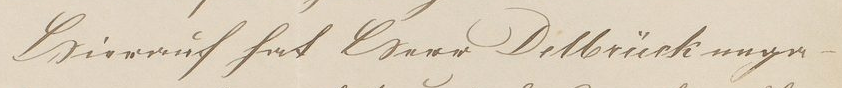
Hierauf hat Herr Delbrück nega-
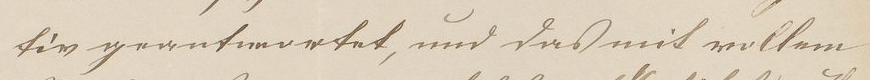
tiv geantwortet, und das mit vollem
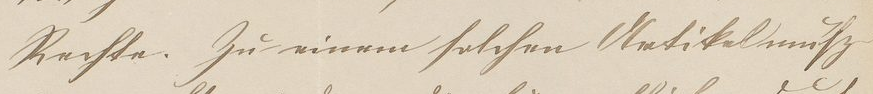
Rechte. Zu einem solchen Artikel müsz-
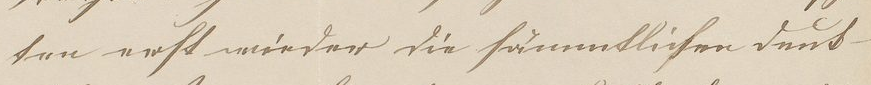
ten erst wieder die sämmtlichen deut-
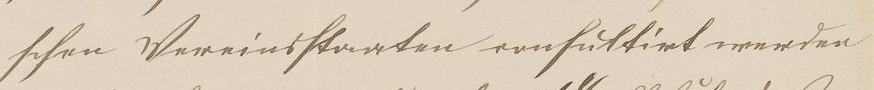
schen Vereinsstaaten consultirt werden
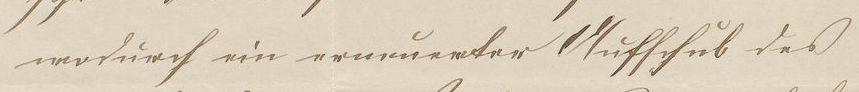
wodurch ein erneuerter Aufschub des
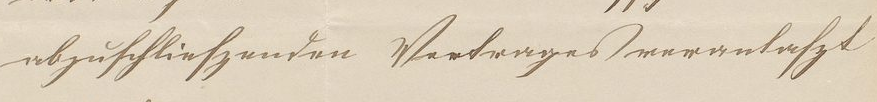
abzuschlieszenden Vertrages veranlaszt
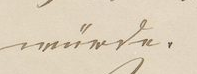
würde.
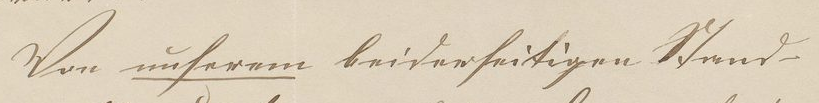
Von unserem beiderseitigen Stand-
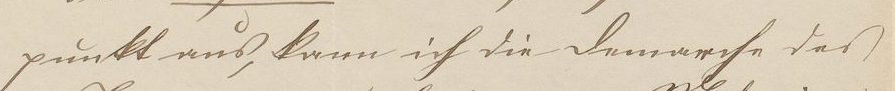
punkt aus, kann ich die Demarche des
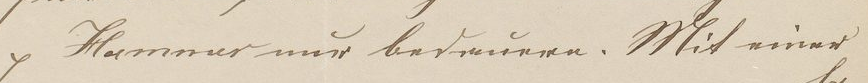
p Hammer nur bedauern. Mit einer
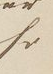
so
